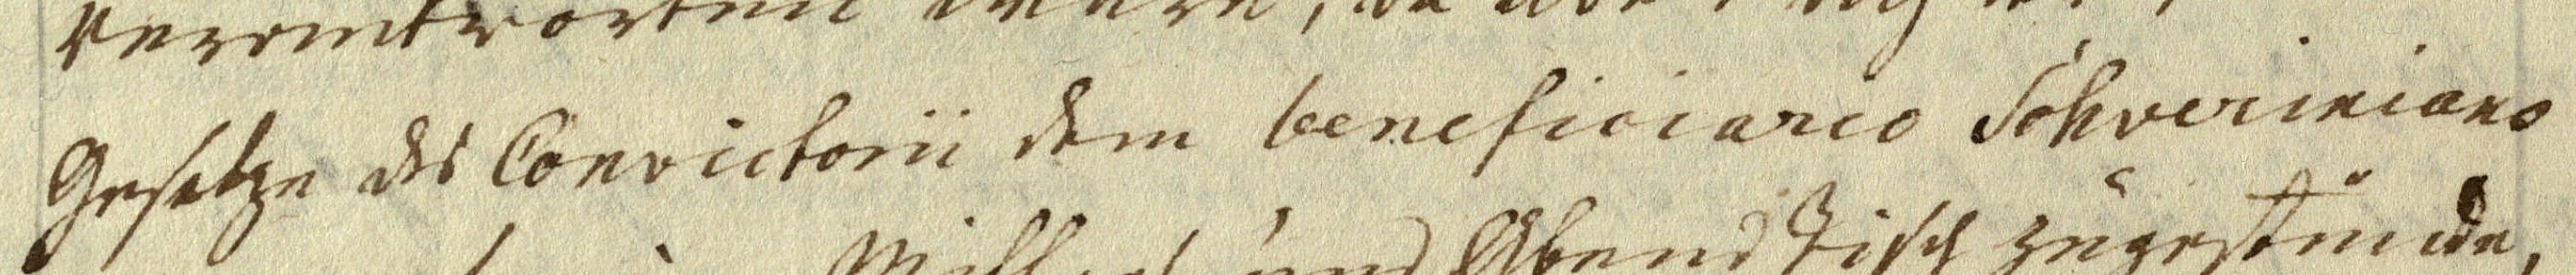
Gesetze des Convictorii dem beneficiario Schveriniano
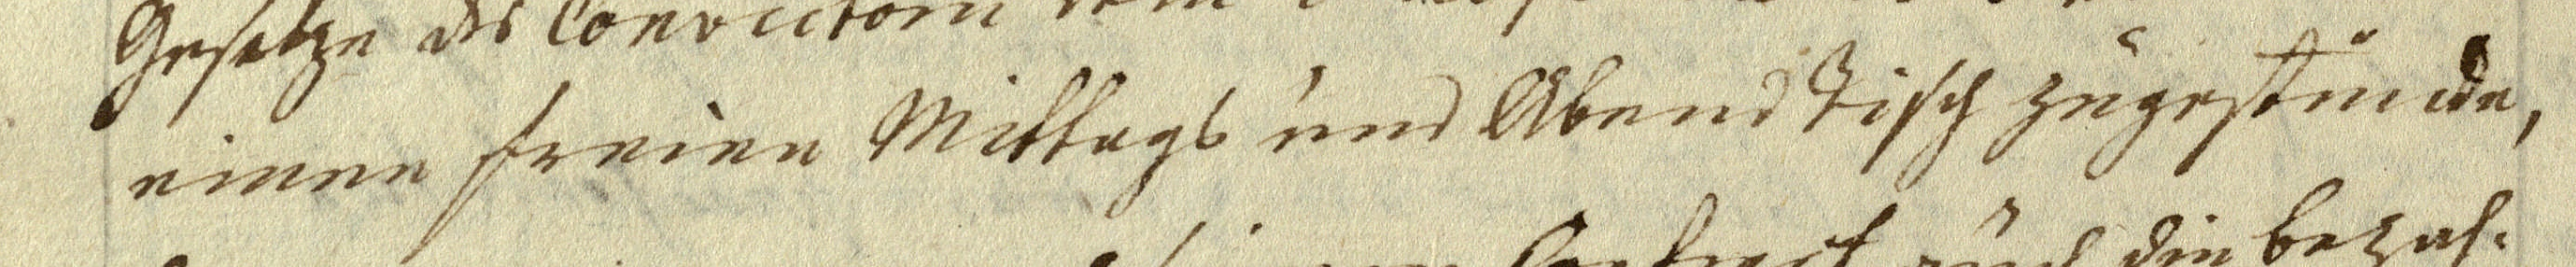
einen freien Mittags und Abend Tisch zugestunde,
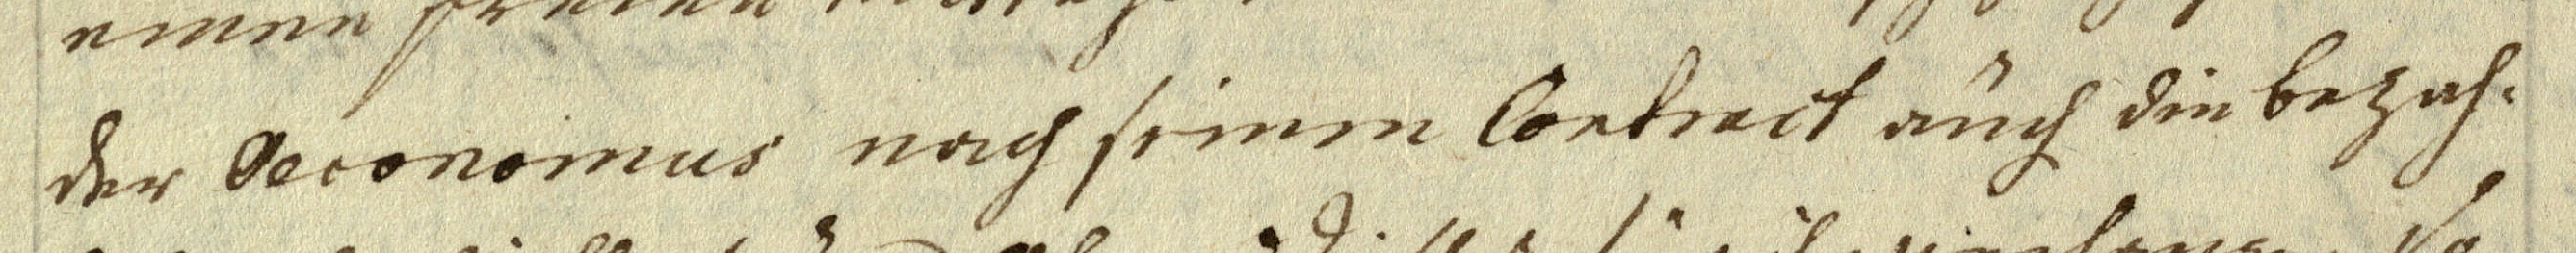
der Oeconomus nach seinen Contract auch die bezah¬
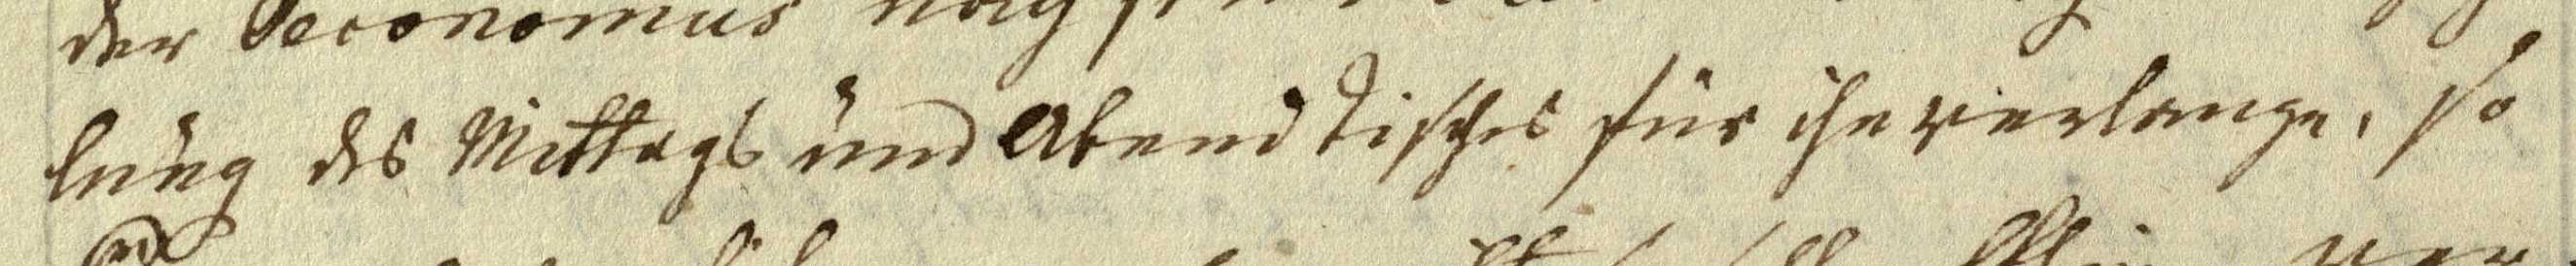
lung des Mittags und Abend Tisches für ihn verlange, so
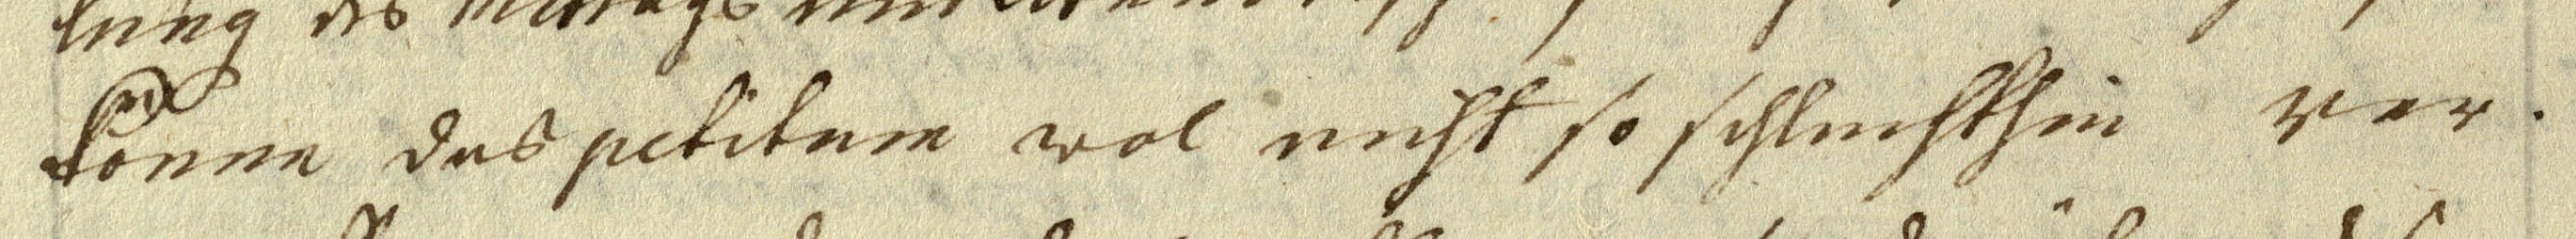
könne das petitum wol nicht so schlechthin ver¬
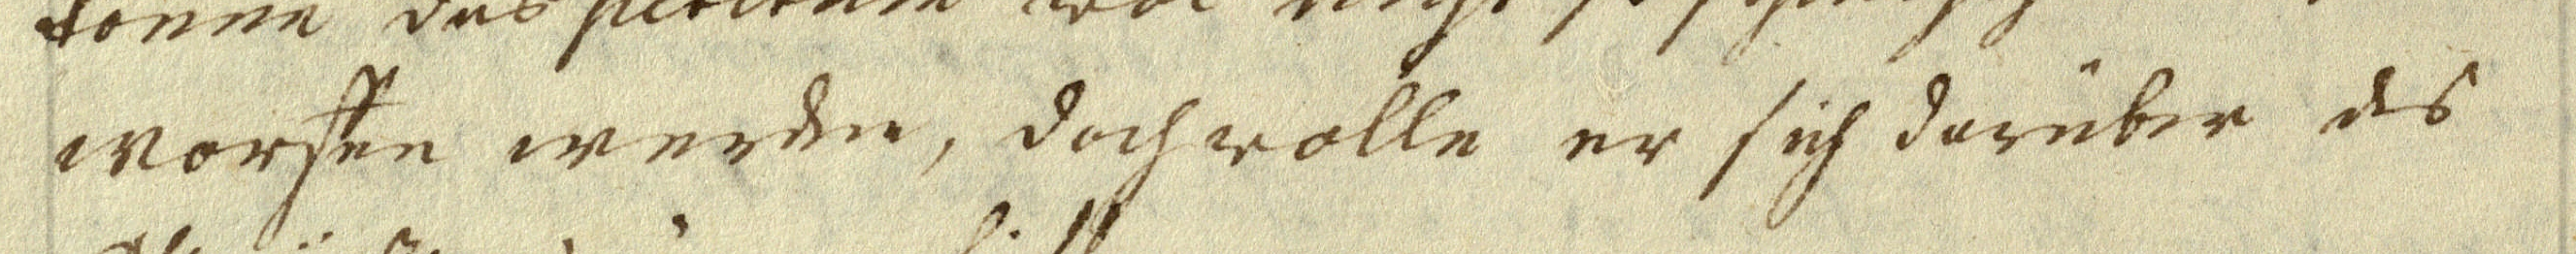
worfen werden, doch wolle er sich darüber des
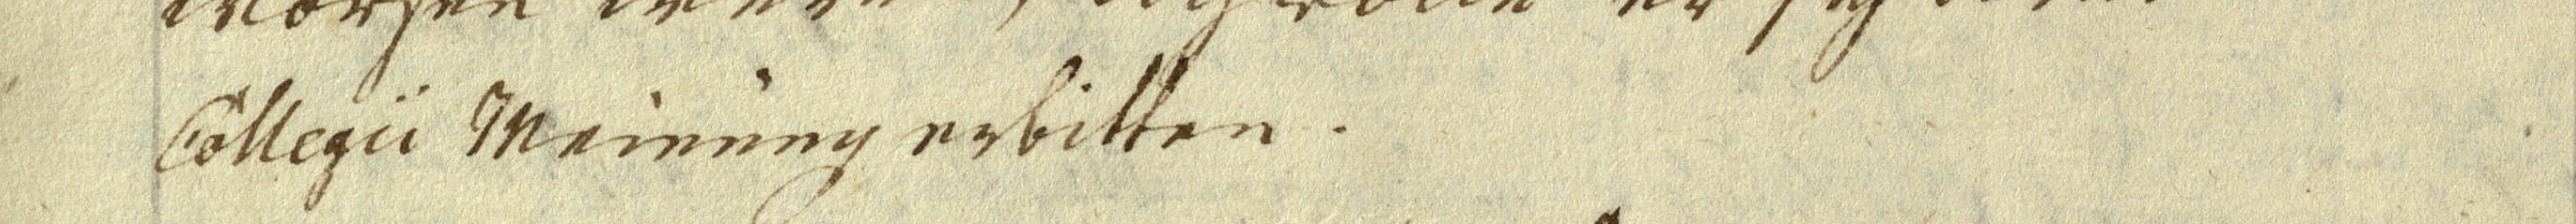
Collegii Meinung erbitten.
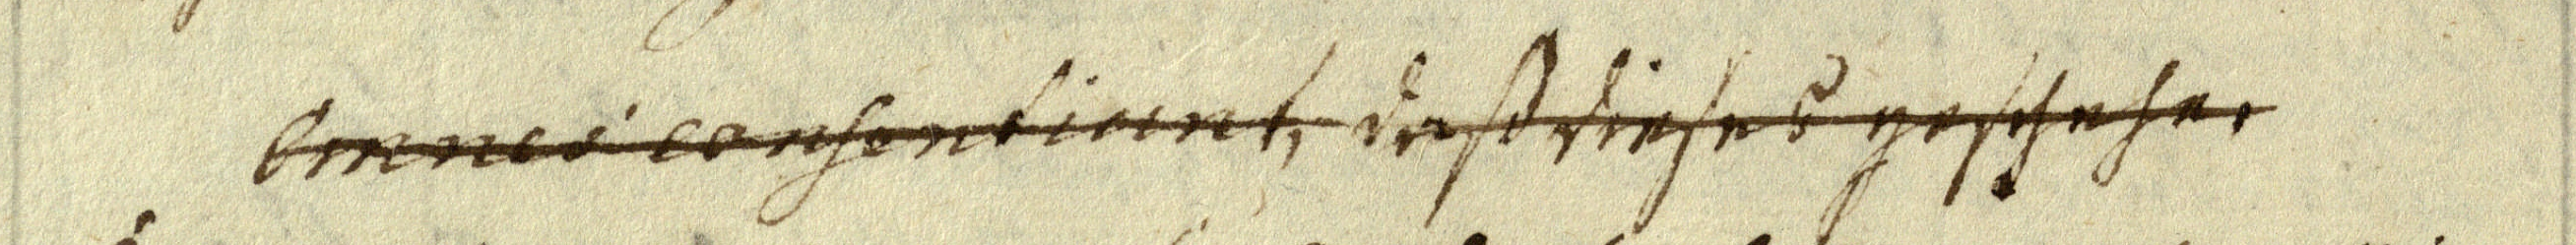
Omnes consentiunt, daß dieses geschehe.
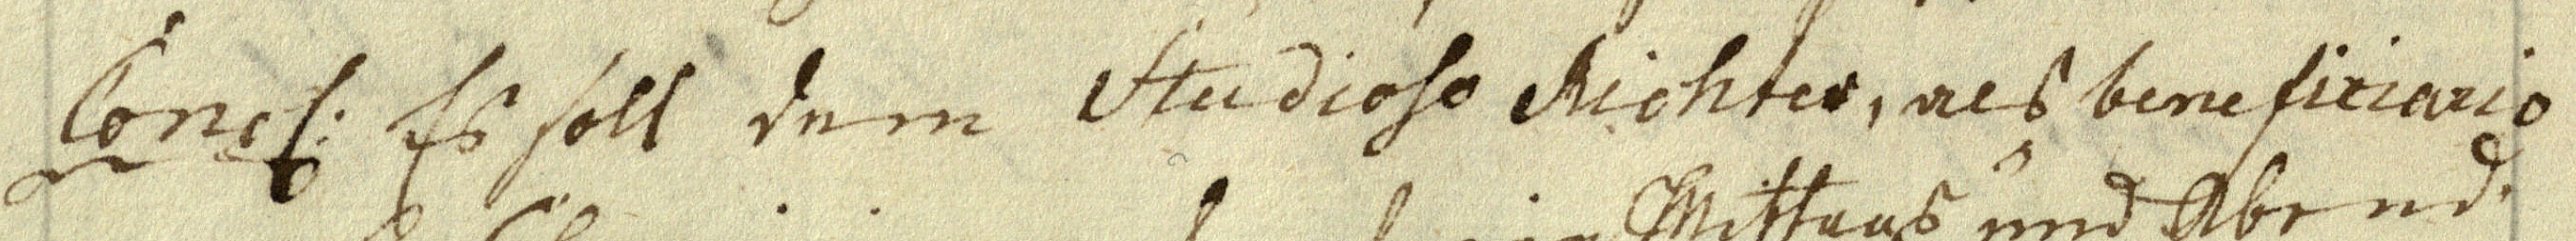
Concl. Es soll dem Studioso Richter als beneficiario
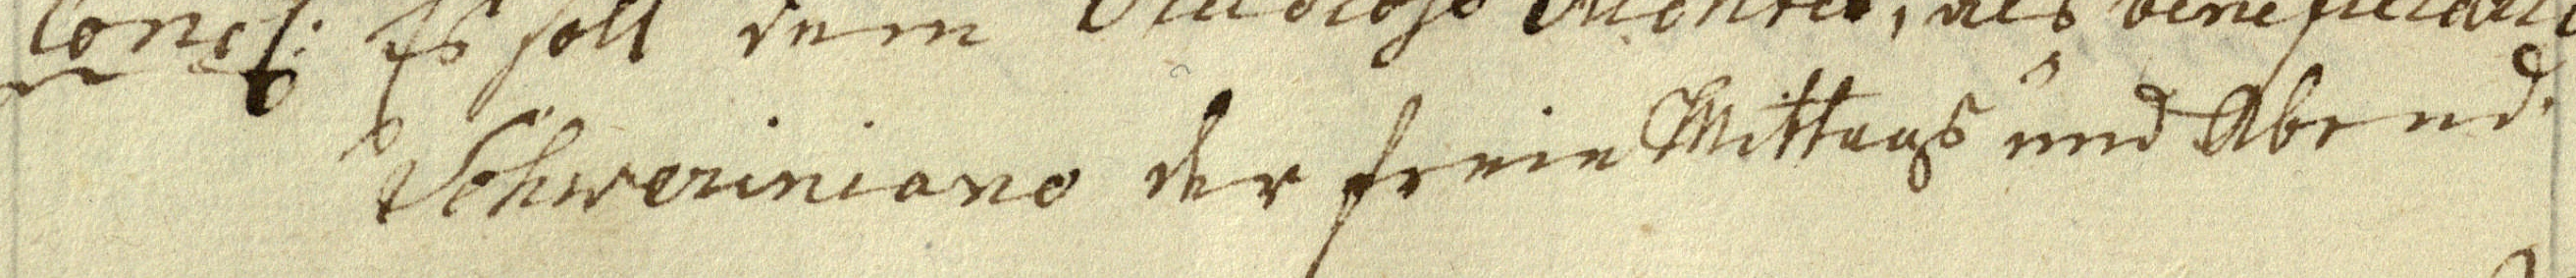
Schweriniano der freie Mittags und Abend
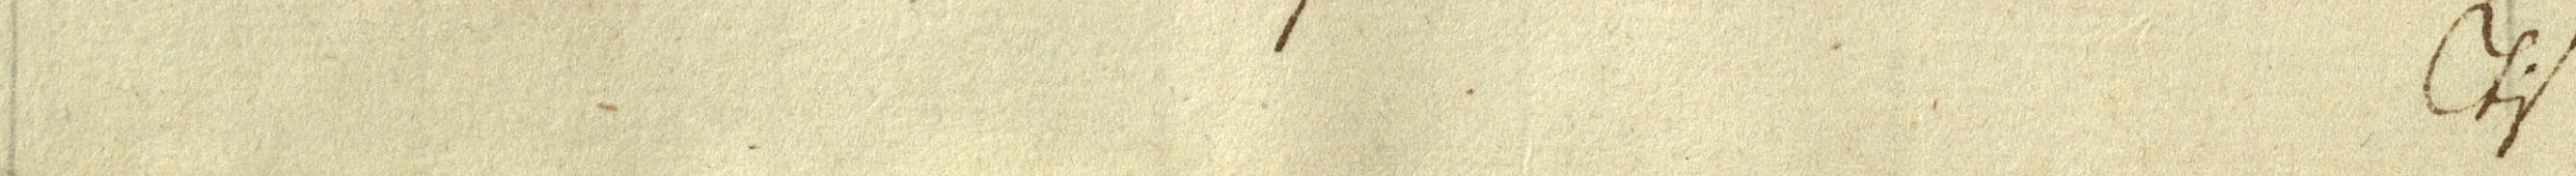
Tisch
